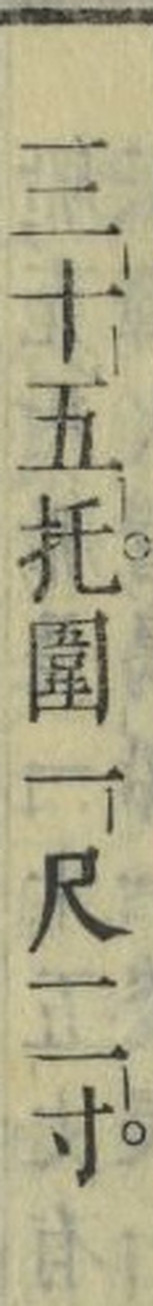三-十-五-托。圍一-尺二-寸。
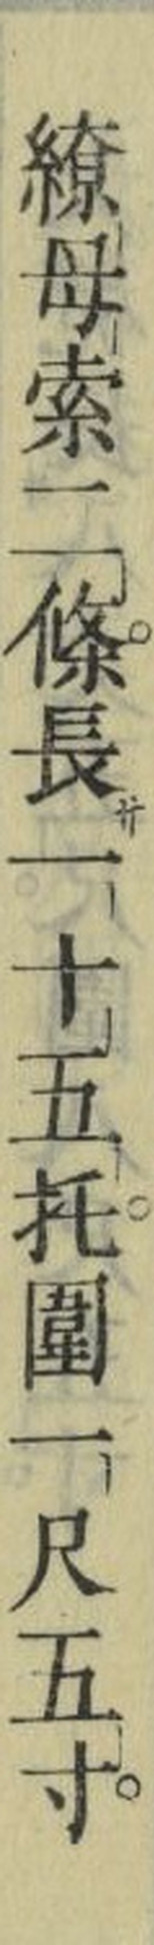繚-母-索二-條。長一-十-五-托。圍一-尺五-寸。
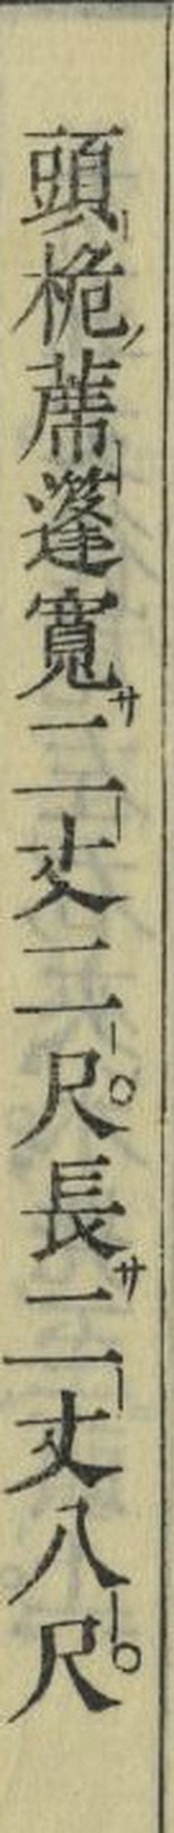頭-桅蓆-篷寬二-丈二-尺。長二-丈八-尺。
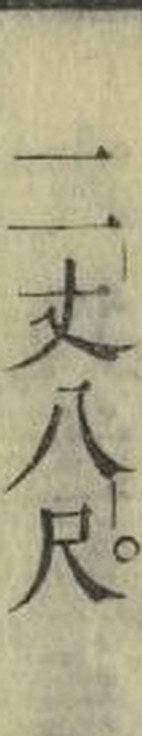二-丈八-尺。
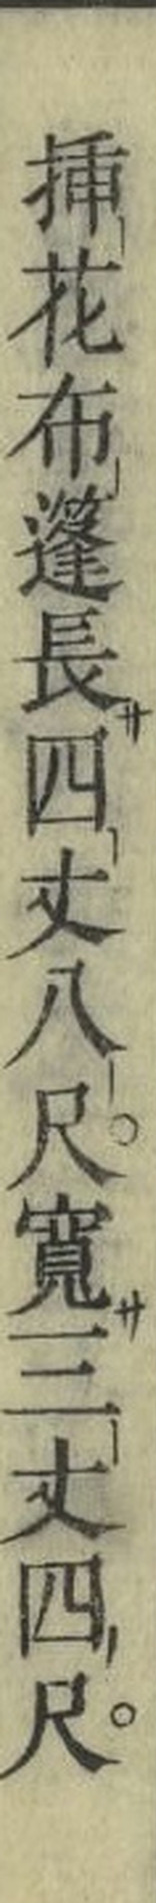挿-花布-篷長四-丈八-尺。寬三-丈四-尺。

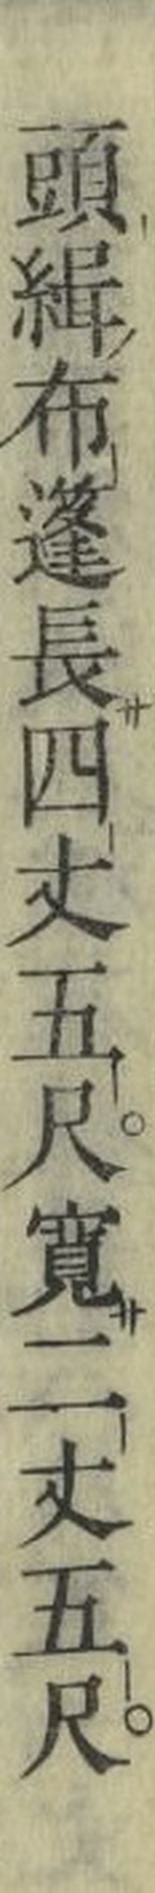頭-緝布-篷長四-丈五-尺。寬二-丈五-尺。
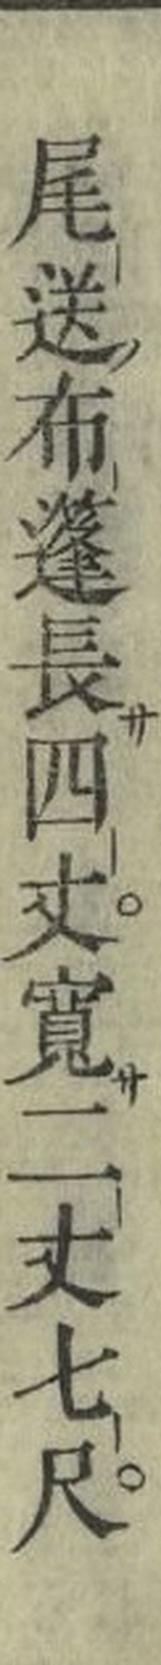尾-送布-篷長四-丈。寬二-丈七-尺。
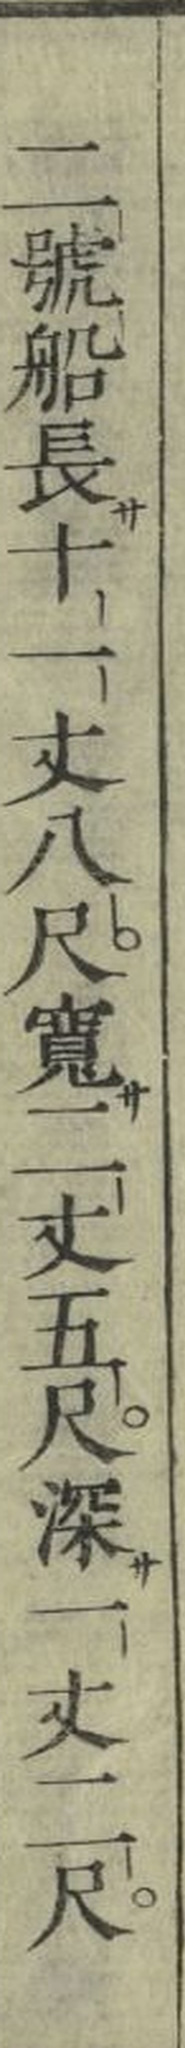二-號-船長十-一-丈八-尺。寬二-丈五-尺。深一-丈二-尺。
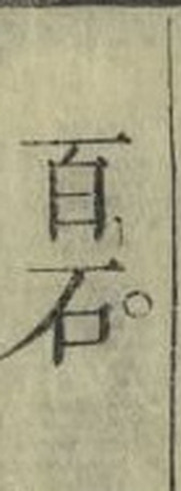百-石。
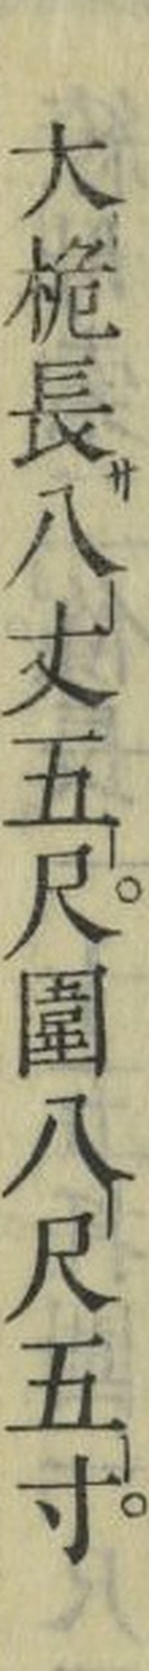大-桅長八-丈五-尺。圍八-尺五-寸。
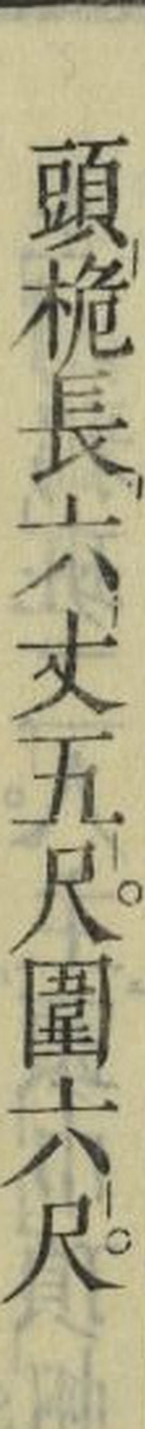頭-桅長六-丈五-尺。圍六-尺。
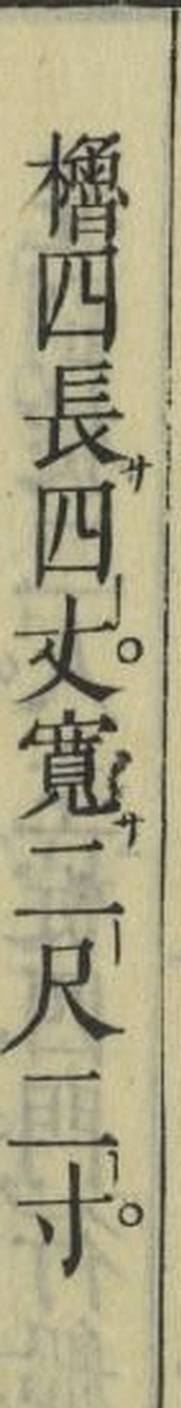櫓四長四-丈。寬二-尺二-寸。
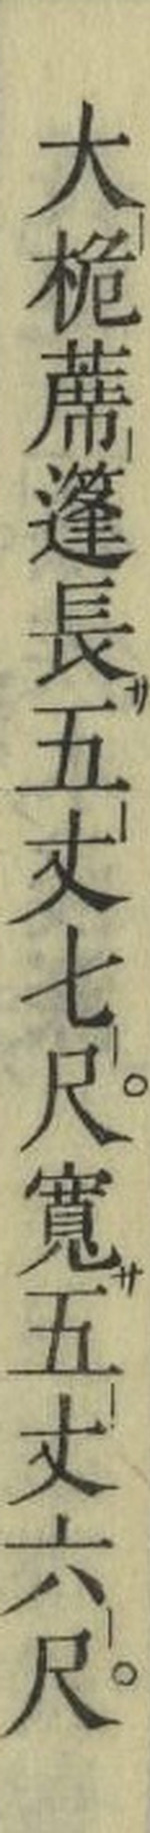大-桅蓆-篷長五-丈七-尺。寬五-丈六-尺。
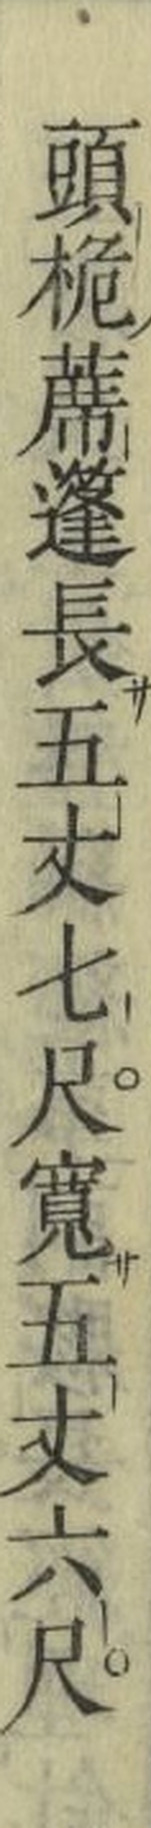頭-桅蓆-篷長五-丈七-尺。寬五-丈六-尺。
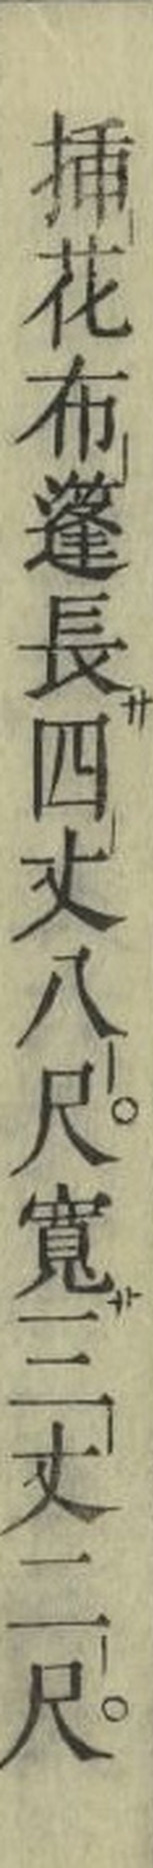挿-花布-篷長四-丈八-尺。寬三-丈二-尺。
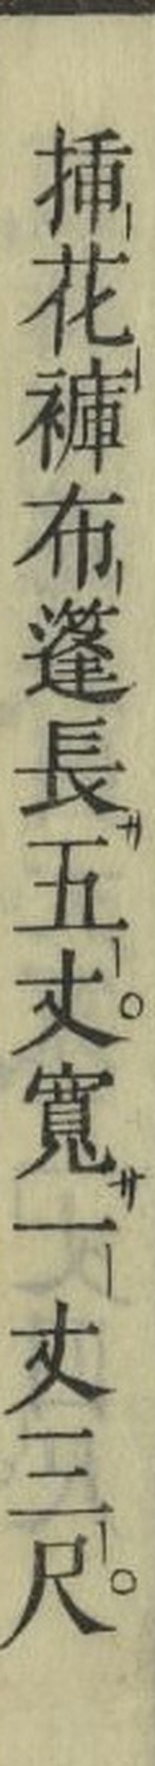挿-花-褲布-篷長五-丈。寬一-丈三-尺。
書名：中山伝信録 巻一
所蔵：University of the Ryukyus Library
